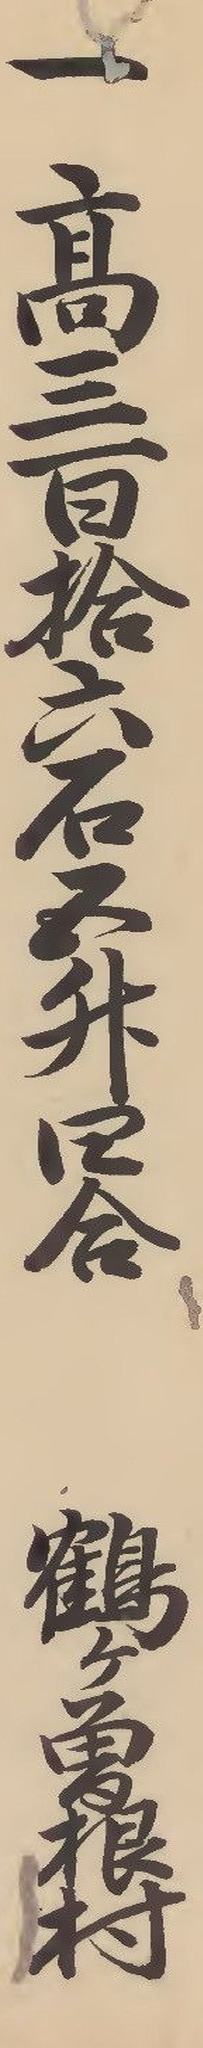一高三百拾六石五升四合鶴ヶ曽根村
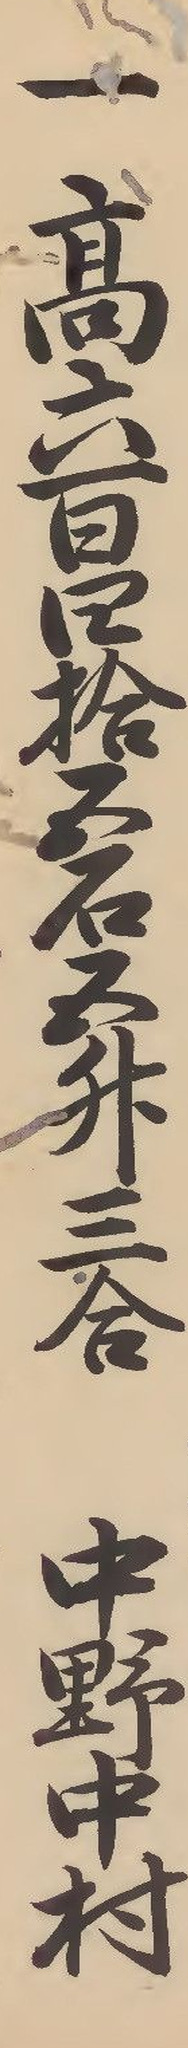一高六百四拾五石五升三合中野中村

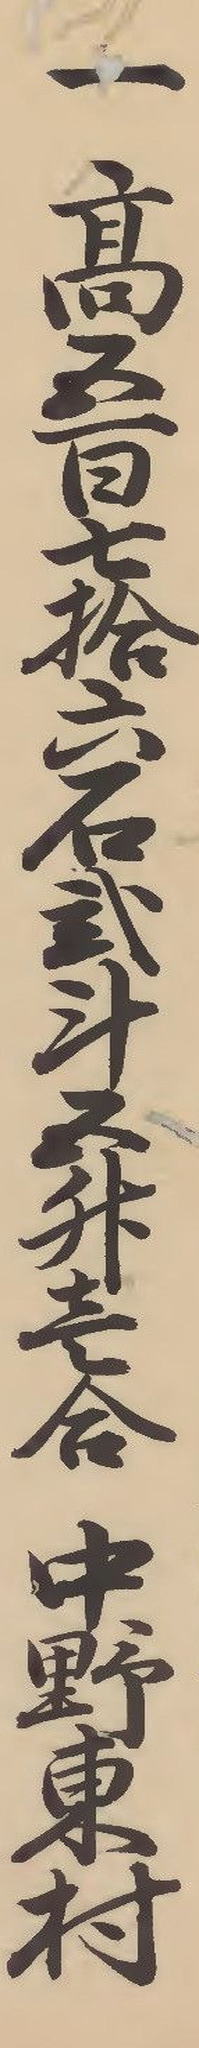一高五百七拾六石弐斗五升壱合中野東村
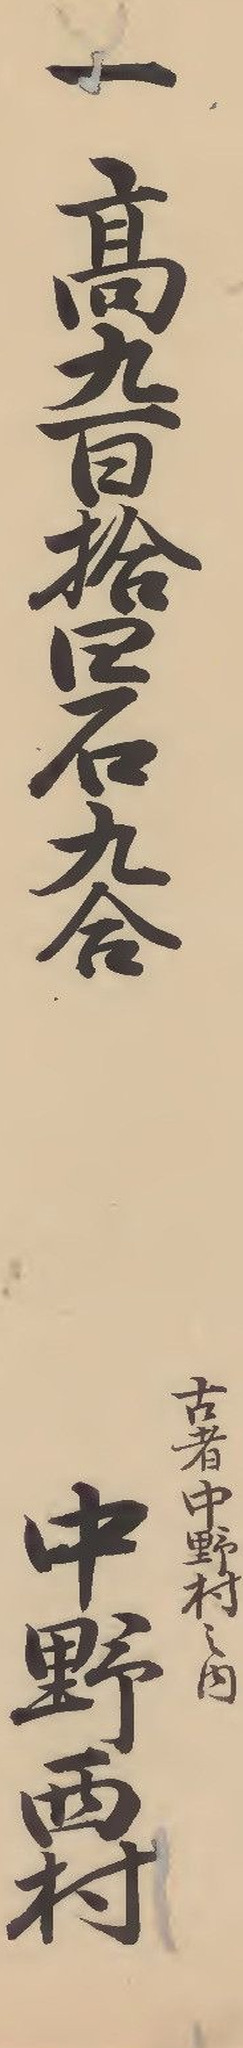一高九百拾四石九合中野西村
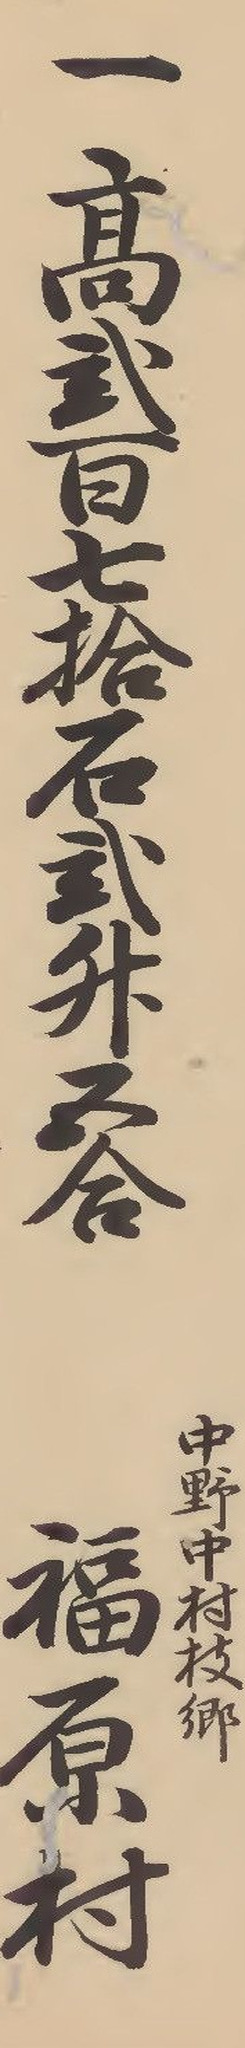一高弐百七拾石弐升五合福原村
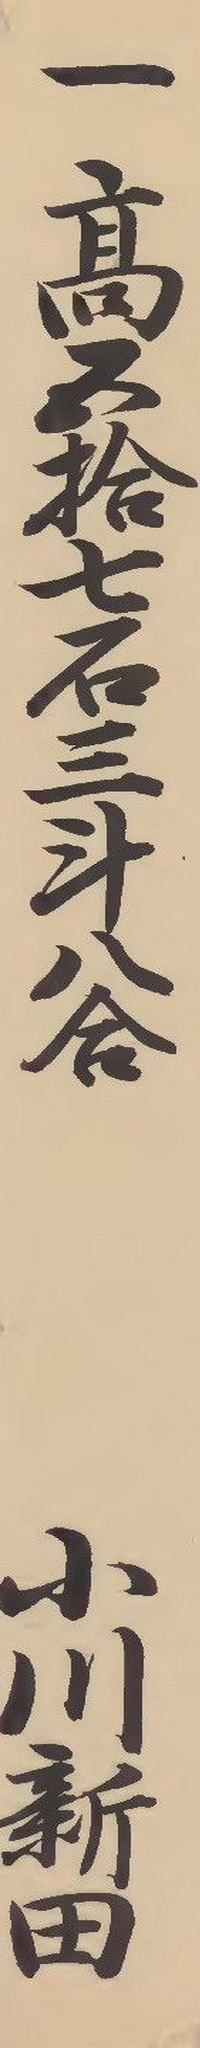一高五拾七石三斗八合小川新田
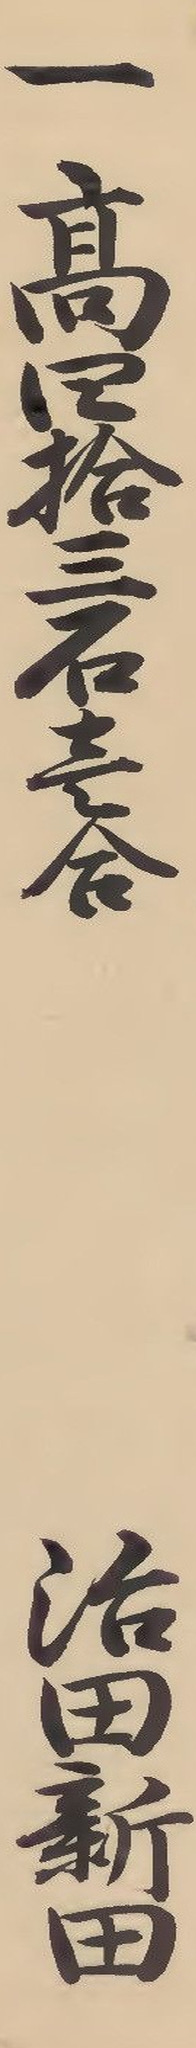一高四拾三石壱合治田新田
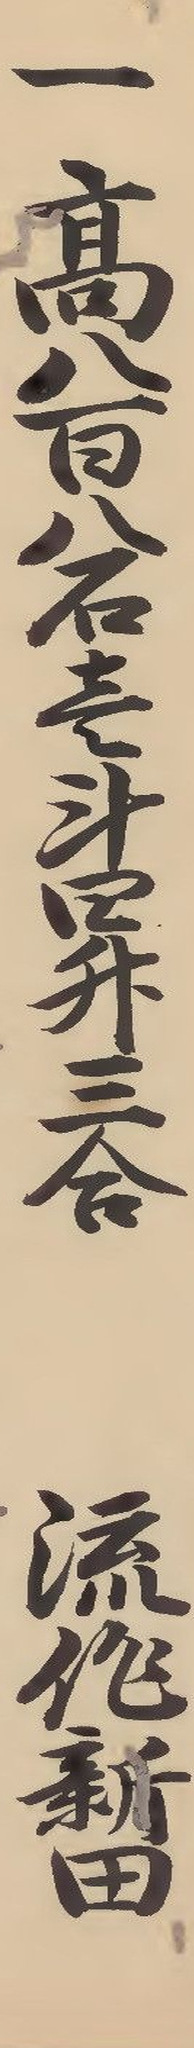一高八百八石壱斗四升三合流作新田
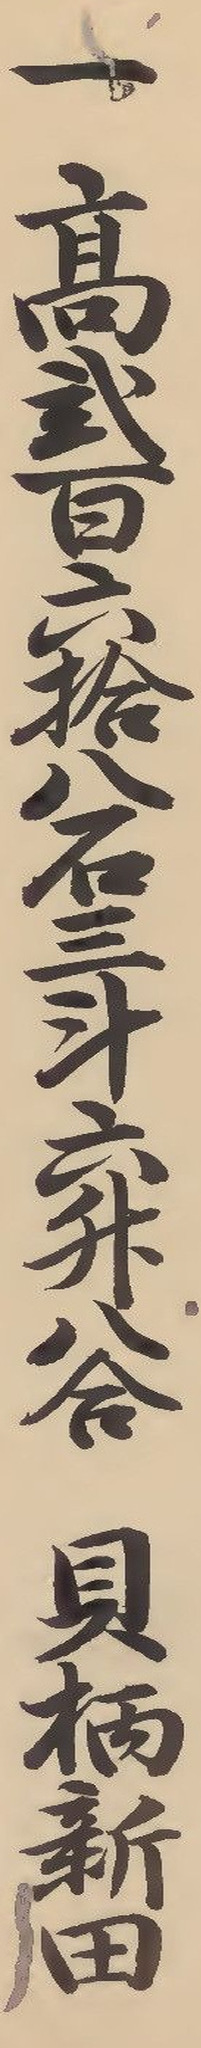一高弐百六拾八石三斗六升八合貝柄新田
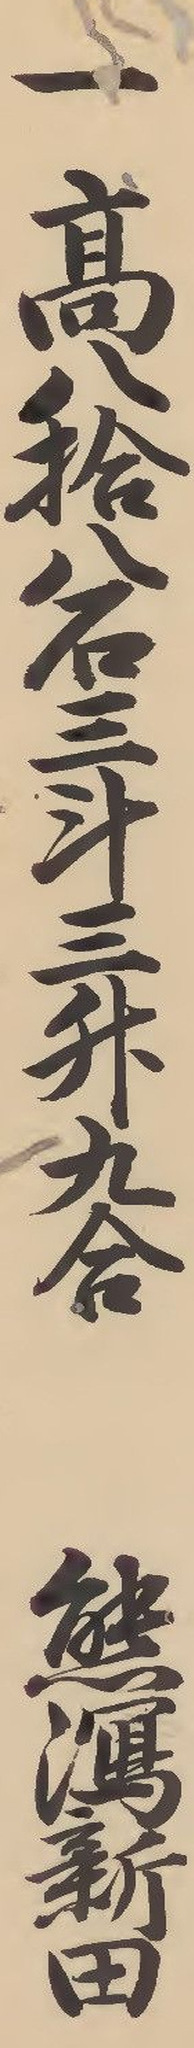一高八拾八石三斗三升九合熊潟新田

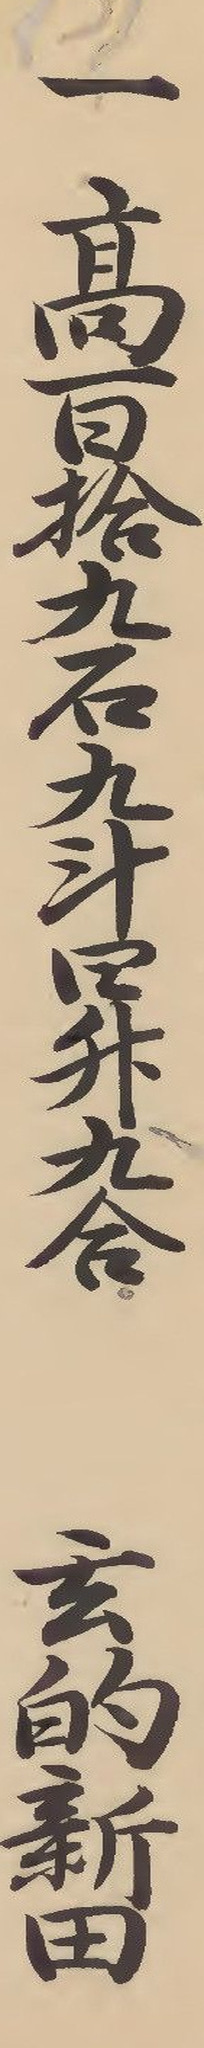一高百拾九石九斗四升九合玄的新田
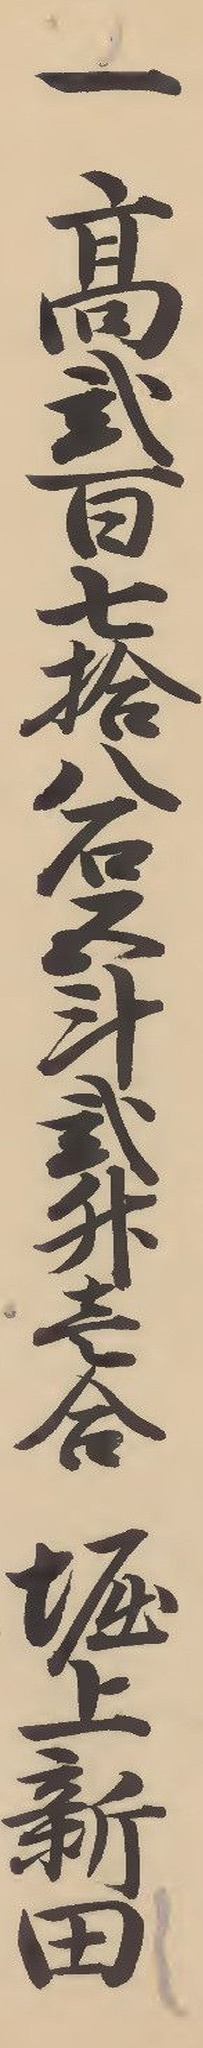一高弐百七拾八石五斗弐升壱合堀上新田
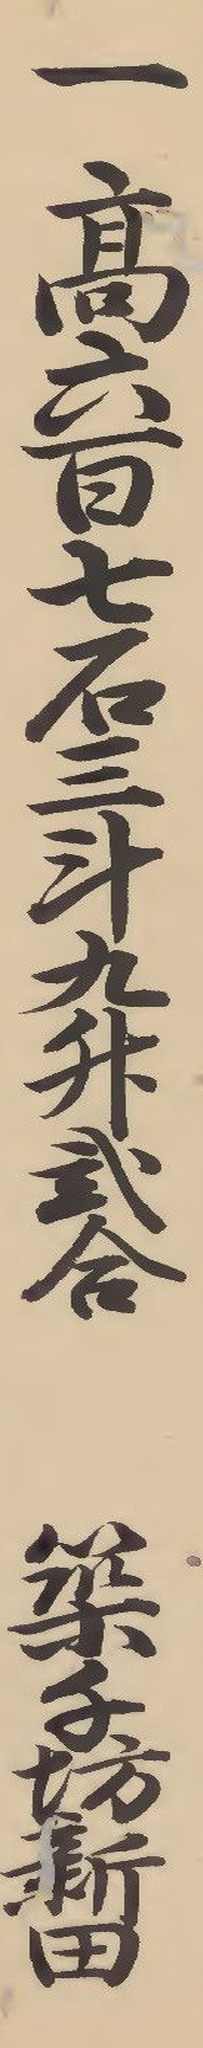一高六百七石三斗九升弐合築千坊新田
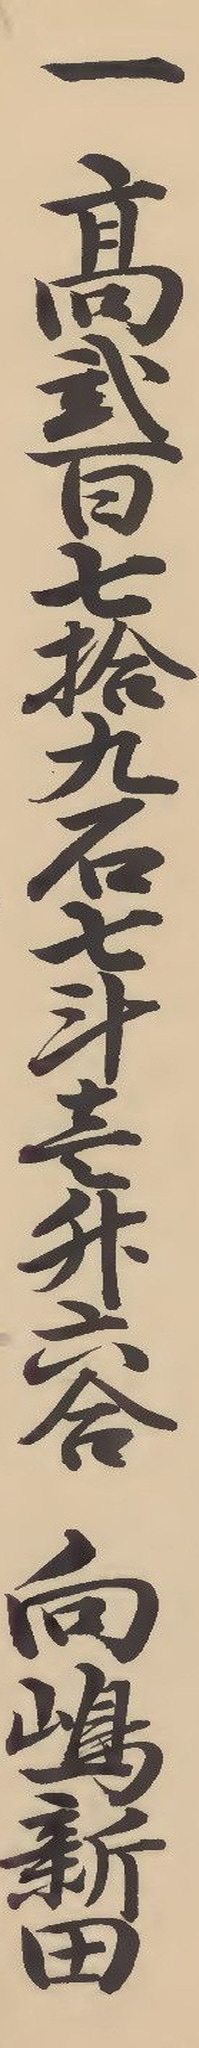一高弐百七拾九石七斗壱升六合向島新田
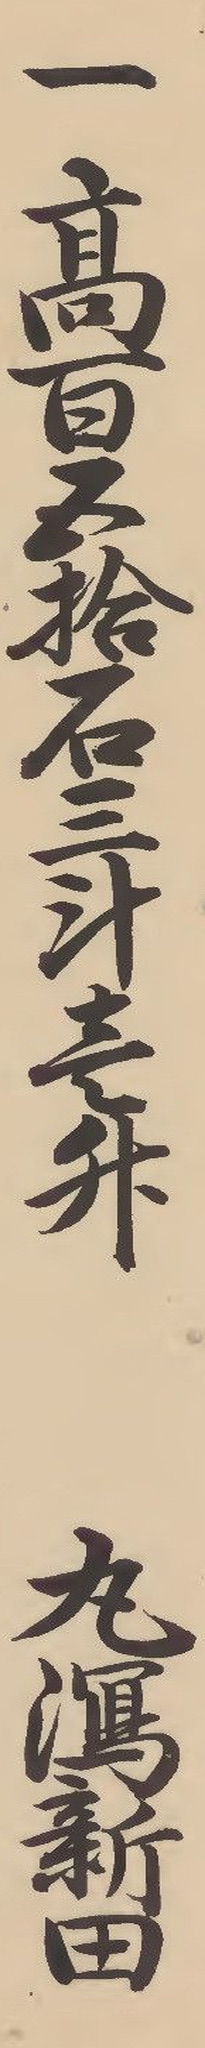一高百五拾石三斗壱升丸潟新田
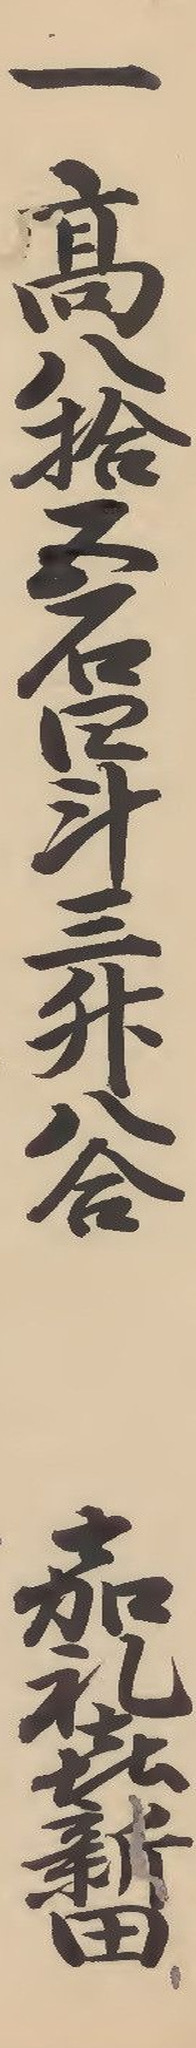一高八拾五石四斗三升八合嘉礼喜新田
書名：越後国郷帳　下
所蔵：国立公文書館 National Archives of Japan
